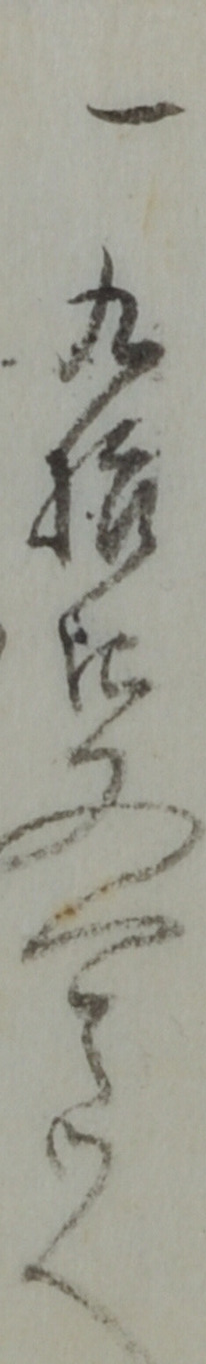一九拾四文人足弐人
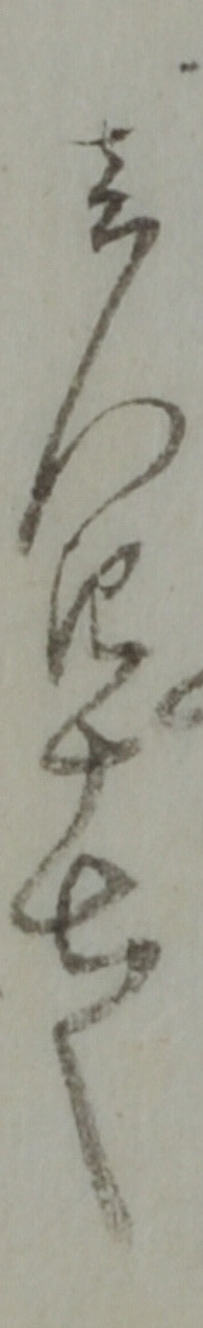壱人四十七人

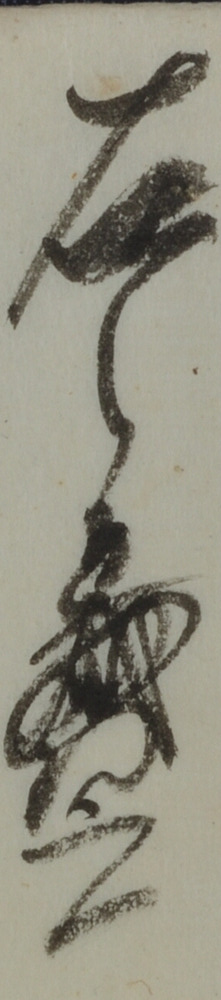右之義六日
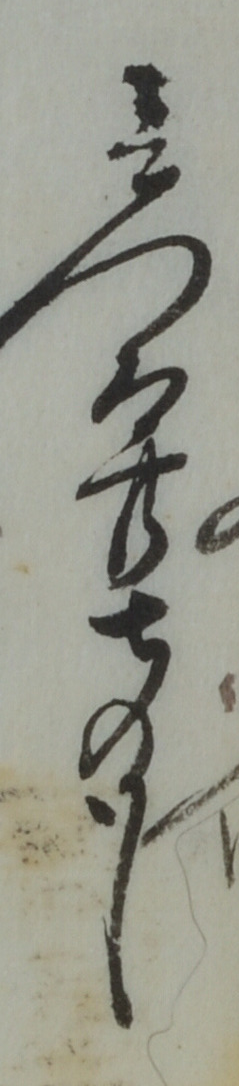壱人百廿七文ヅツ
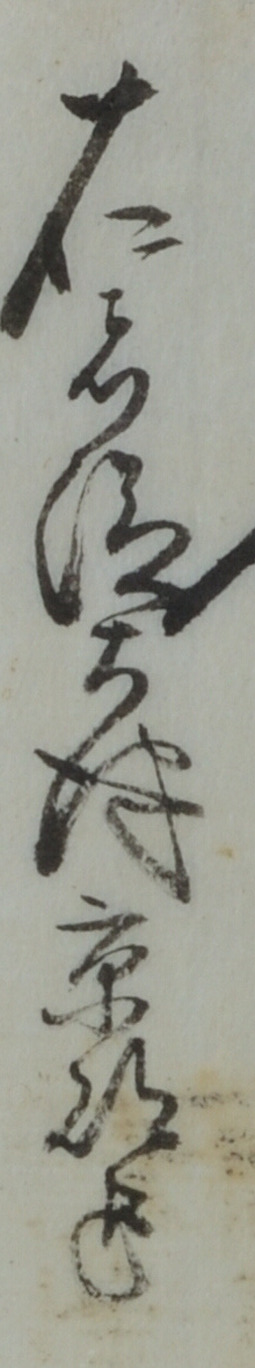右は従大津京都迄
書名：従信州高遠京都迠人馬駄賃帳
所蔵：伊那市立高遠町図書館・合同会社AMANE
